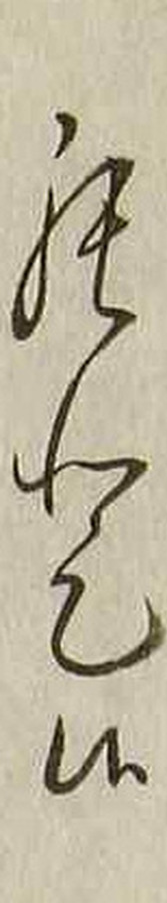罷登候
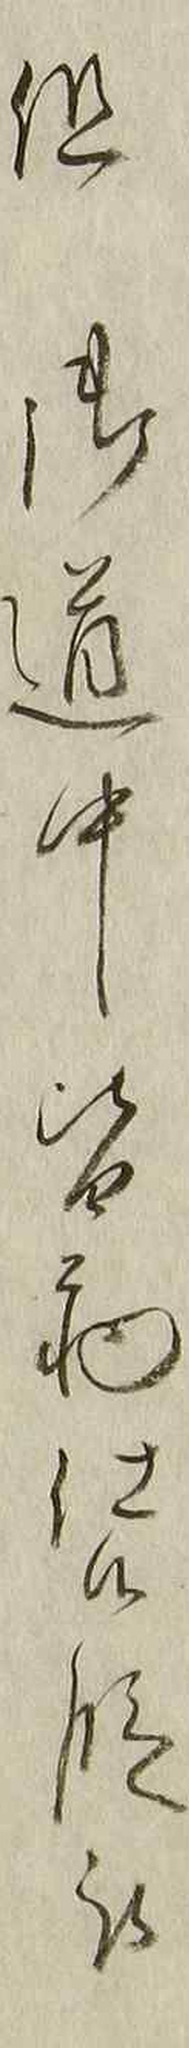但御道中皆勤仕候段被
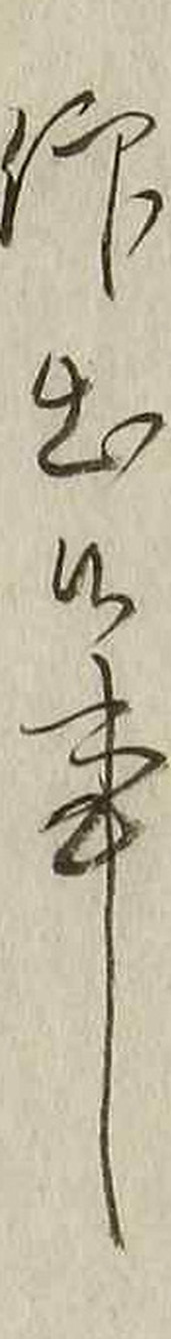仰出候事
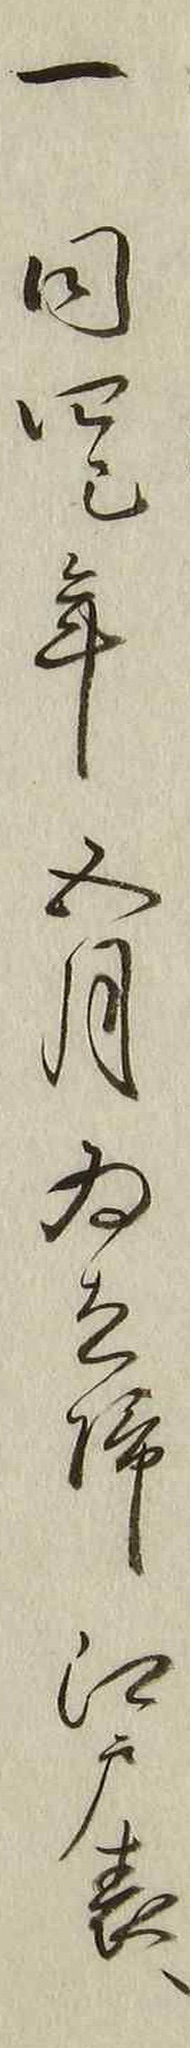一同四巳年五月為立帰江戸表へ
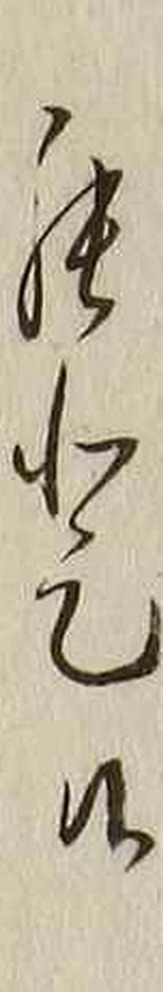罷登候
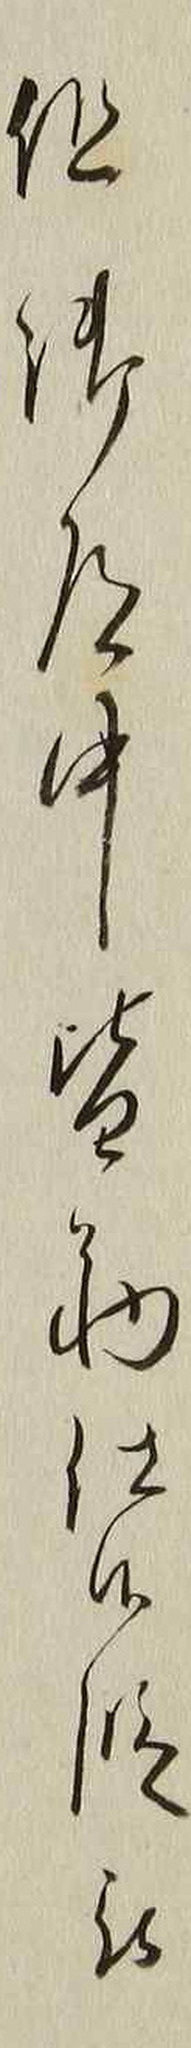但御道中皆勤仕候段被
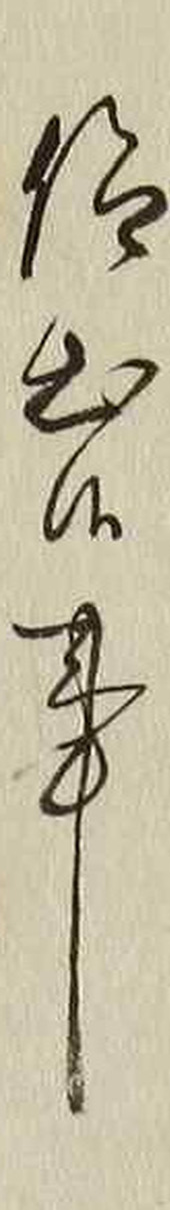仰出候事
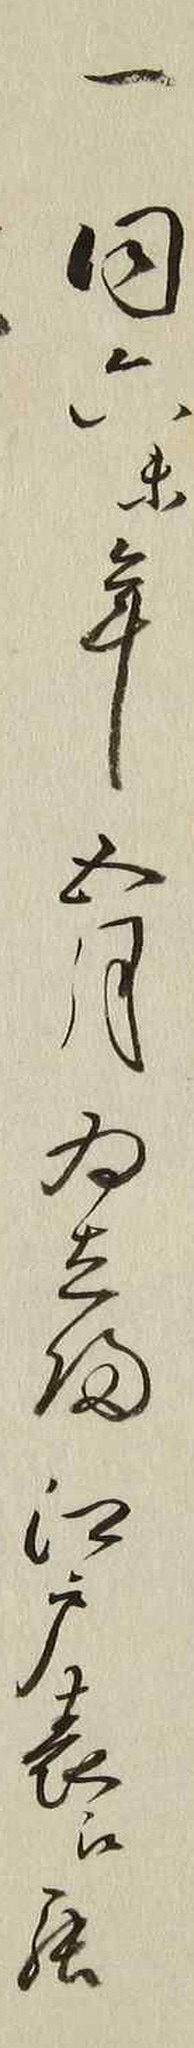一同六未年五月為立帰江戸表江罷
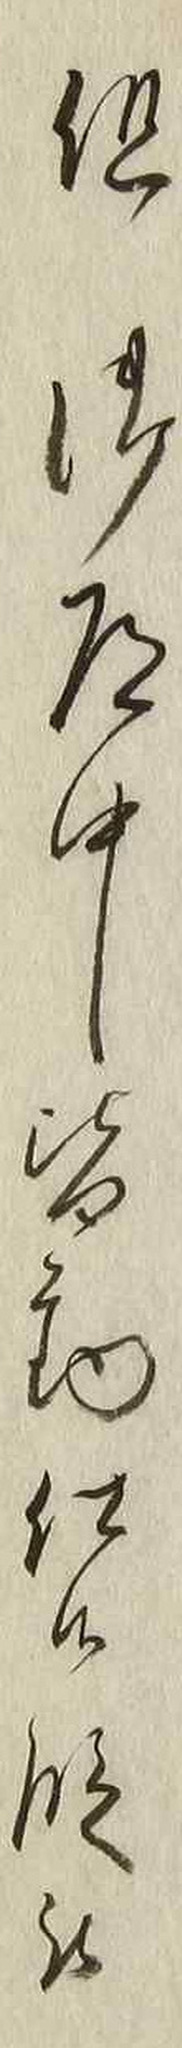但御道中皆勤仕候段被
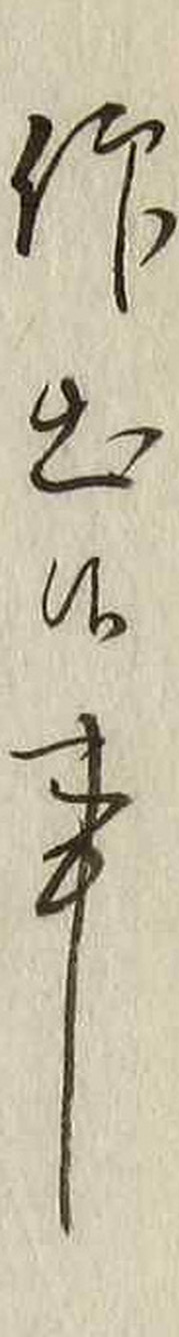仰出候事
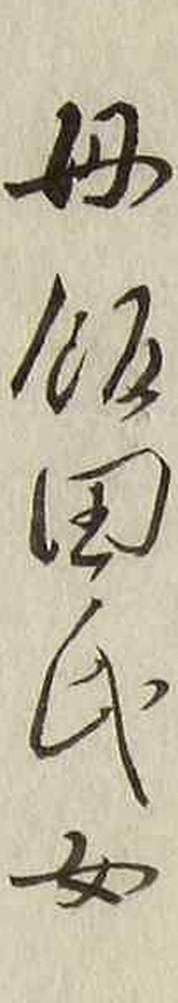母飯田氏女
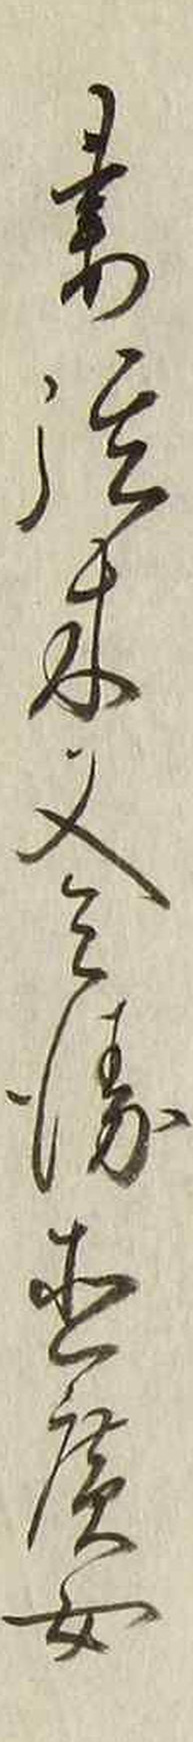妻弦木又兵衛直廣女

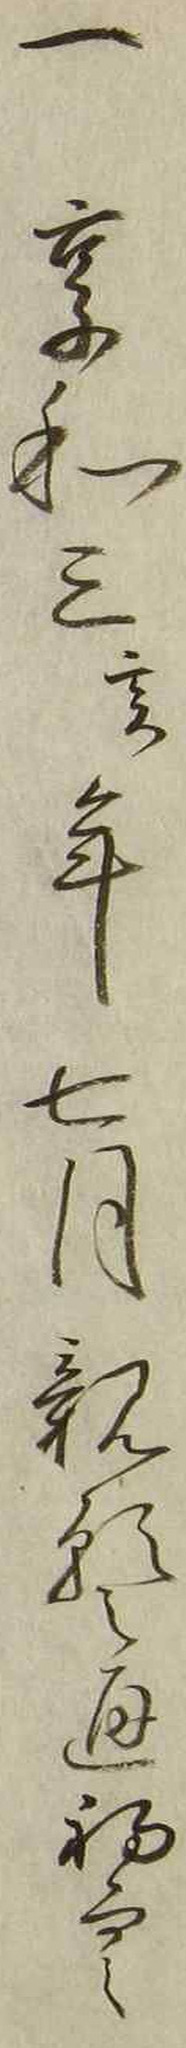一享和三亥年七月親願之通初而之
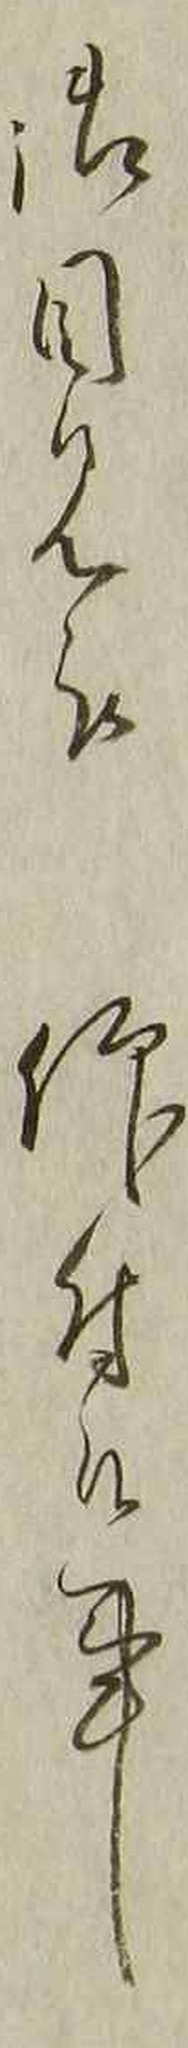御目見被仰付候事
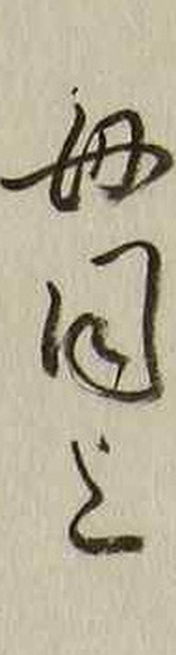母同上
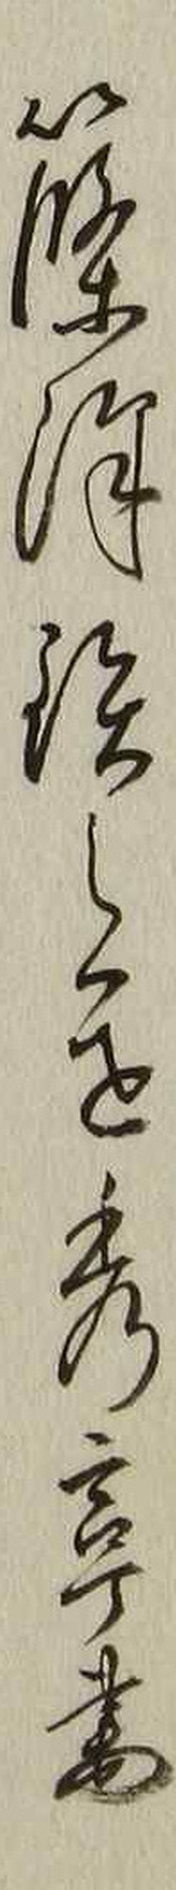女篠沢鉄之進秀寧妻
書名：諸士系譜　巻之6　い之部6
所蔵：会津若松市立会津図書館
